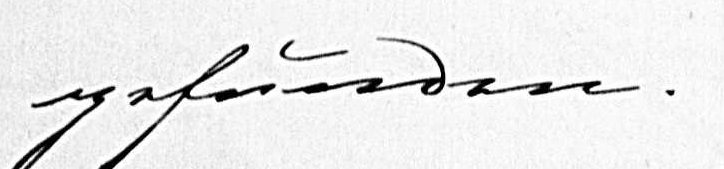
gefunden.
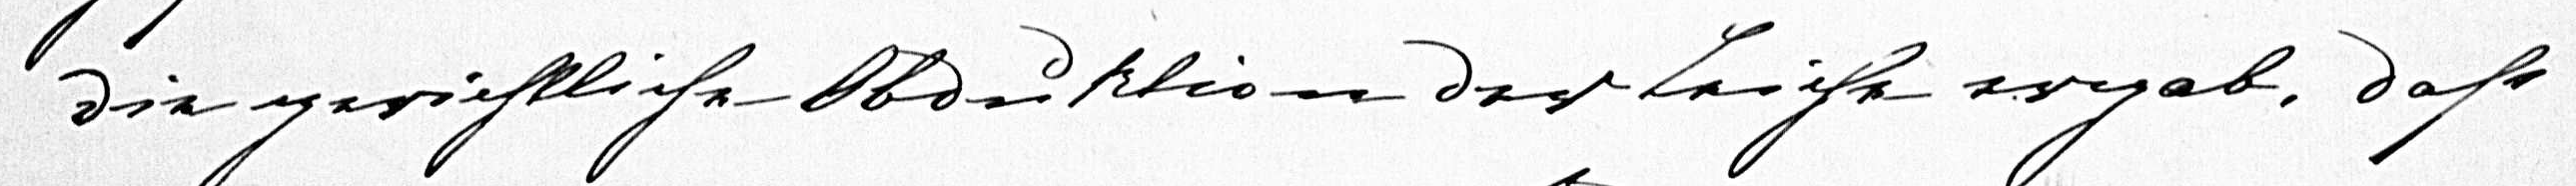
Die gerichtliche Obduktion der Leiche ergab, daß
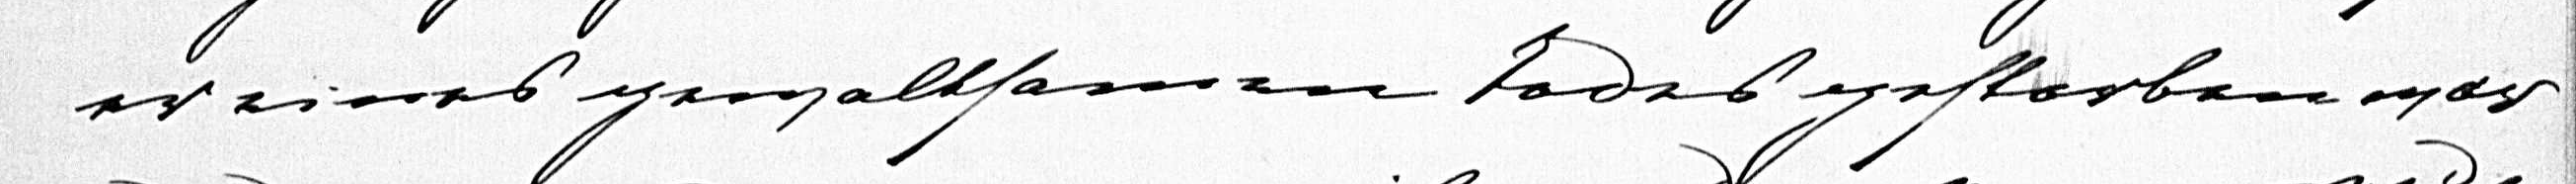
er eines gewahlsamen Todes gestorben war
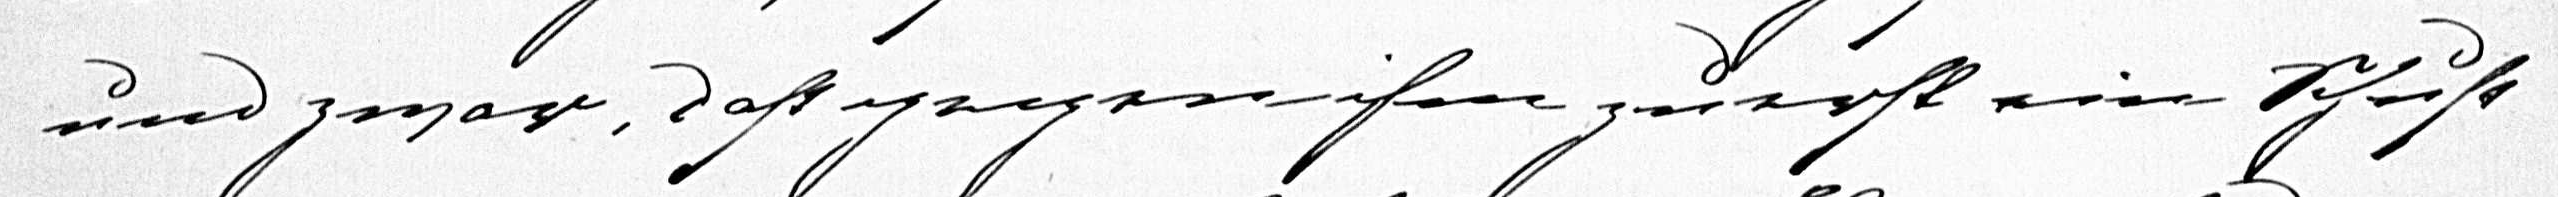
und zwar, daß gegen ihm zuerst ein Schuß
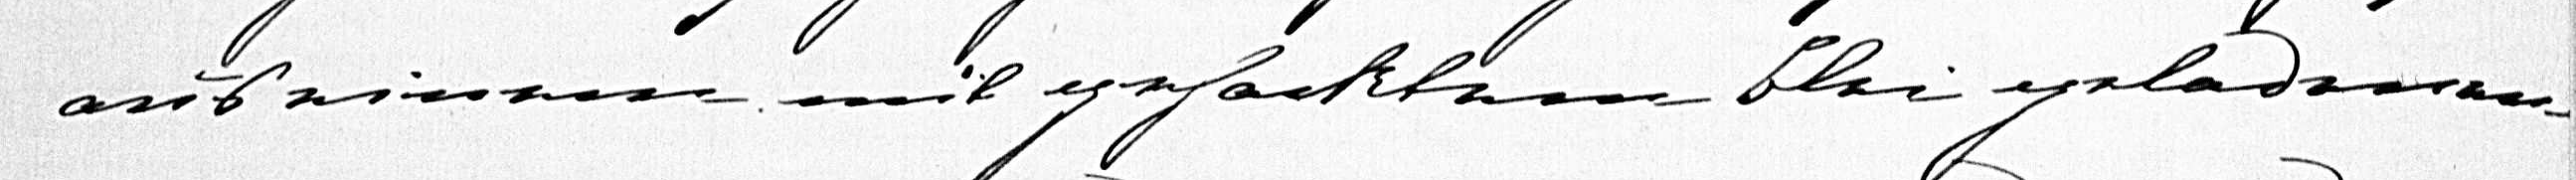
aus einem mit gehacktem Blei geladenen-
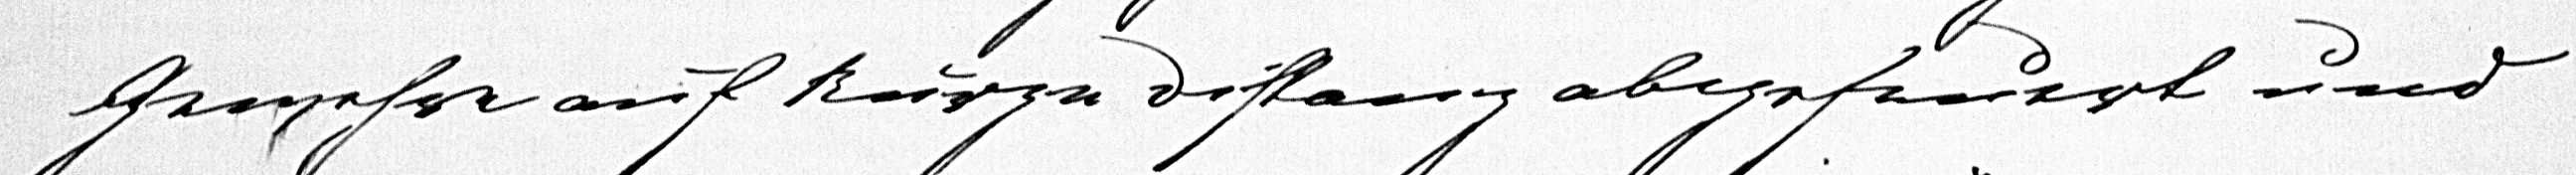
Gewehre auf kurze Distanz abgeheuert und
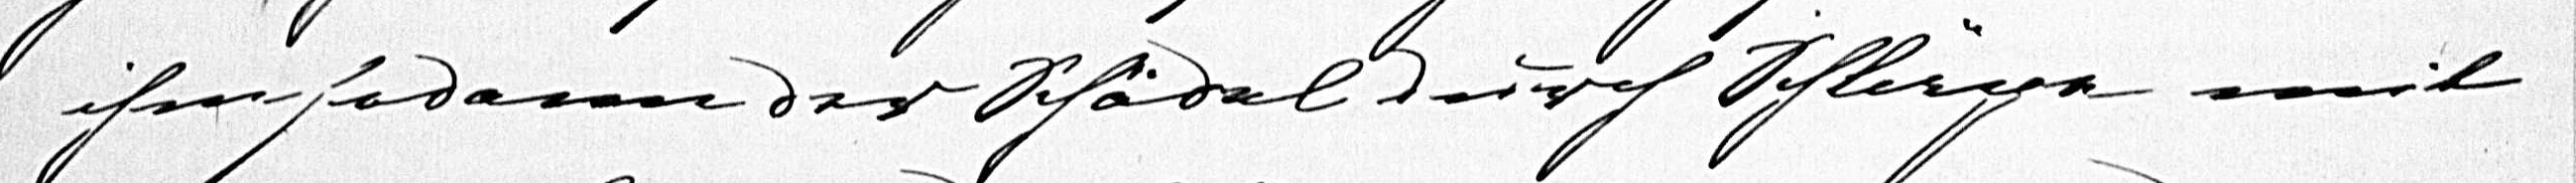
ihm sodann der Schädel durch Schläge mit
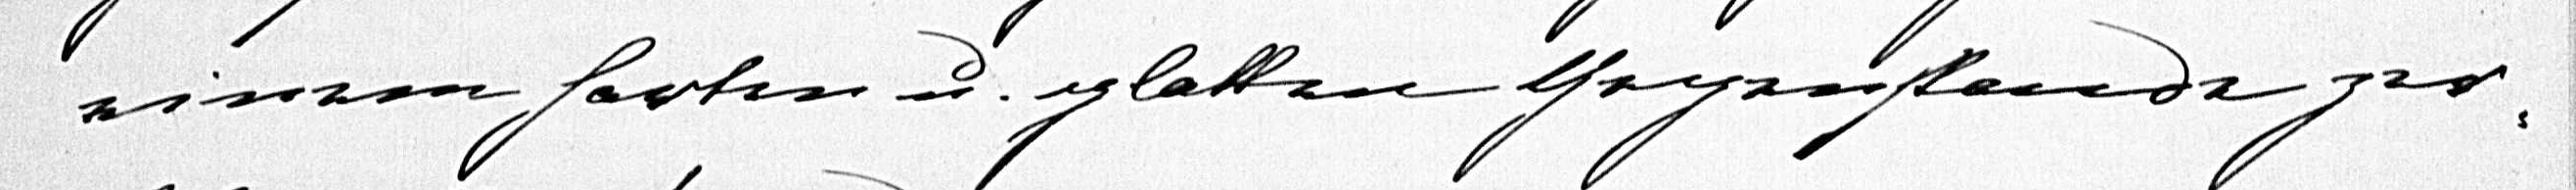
einem harten u. glatten Gegenstande zer¬
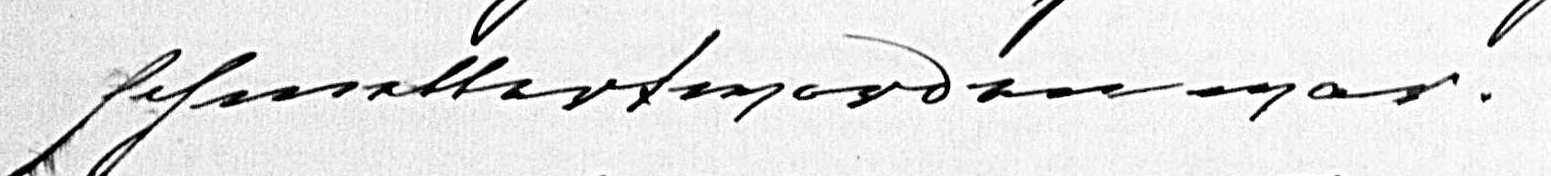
schmettert worden war.
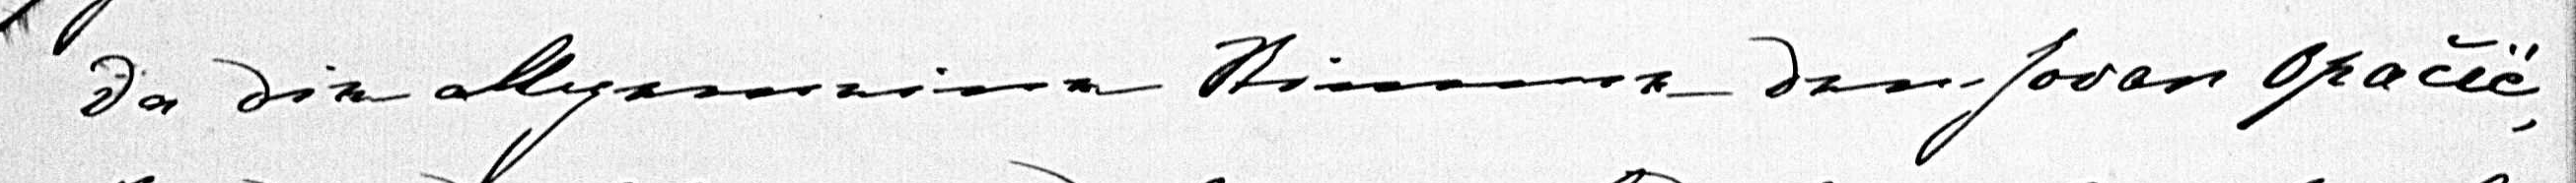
Da die allgemeine Stimme den Jovan Opačić,
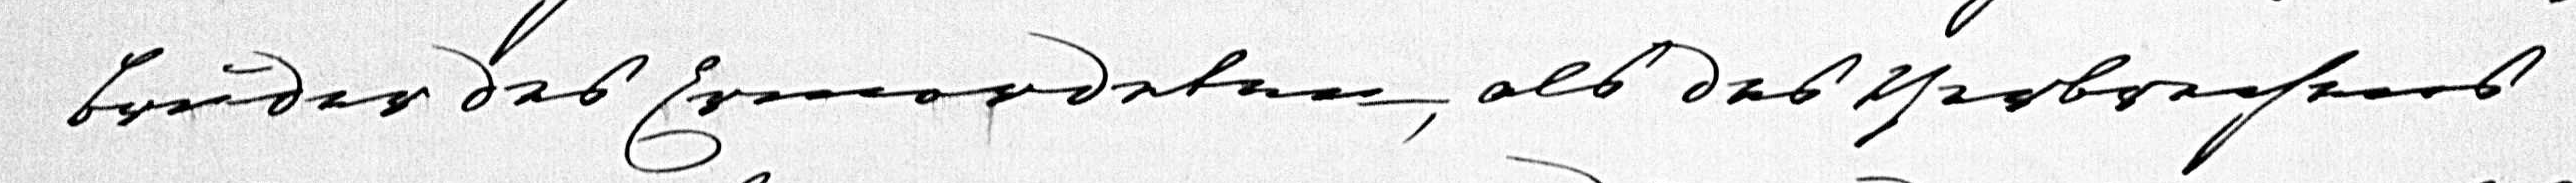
Bruder des Ermordeten, als des Verbrechens
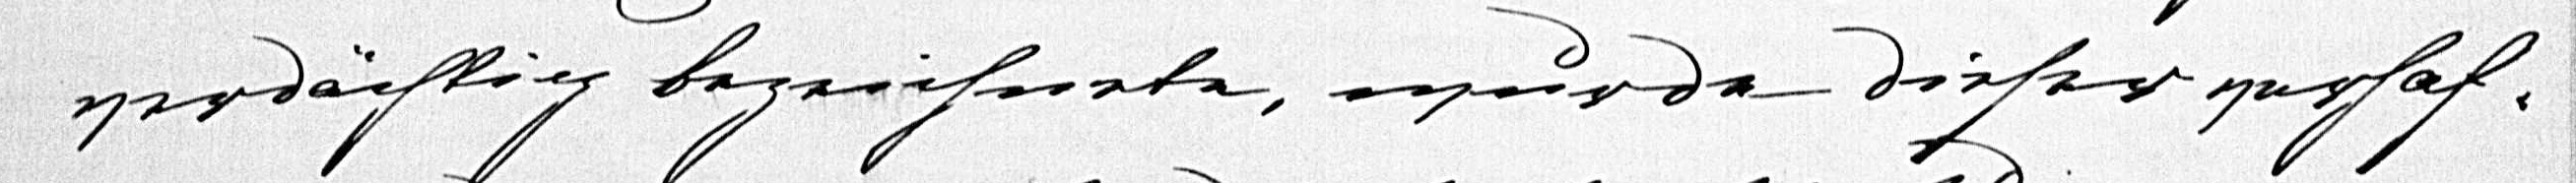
verdächtig bezeichnete, wurde dieser verhaf¬
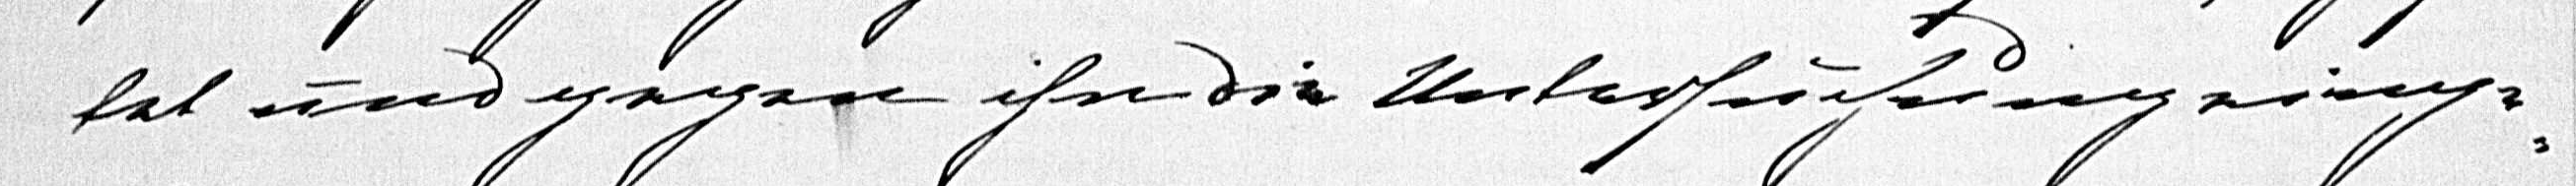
tet und gegen ihn die Untersuchung einge¬
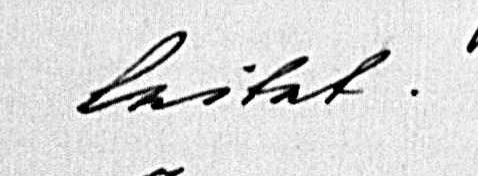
leitet.
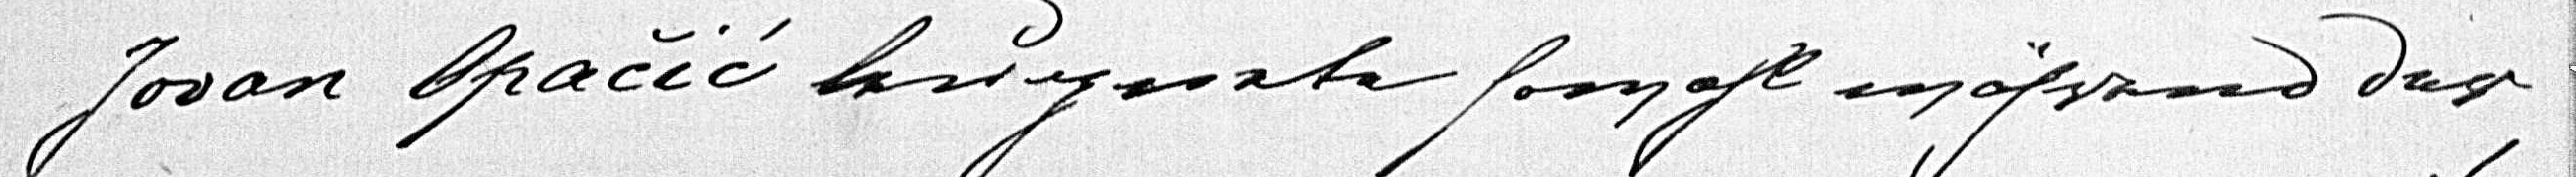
Jovan Opačić leugnete sowahl wöhrend der
